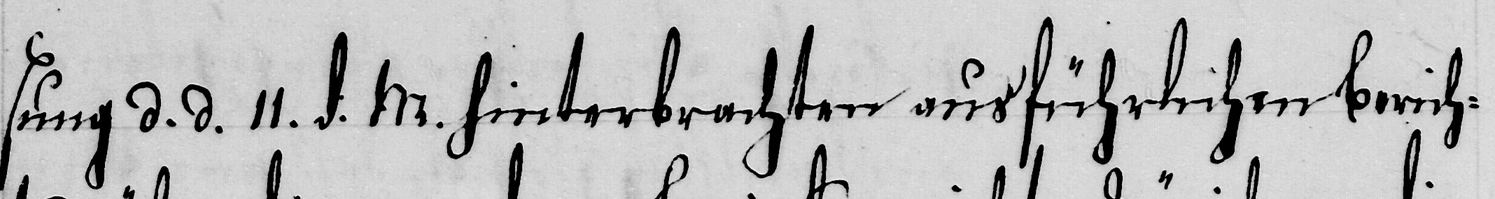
sung d. d. 11 d. M. hinterbrachten ausführlichen Berich¬
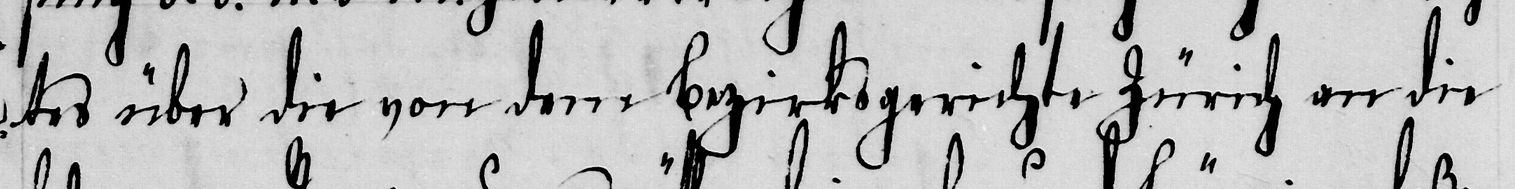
tes über die von dem Bezirksgerichte Zürich an die
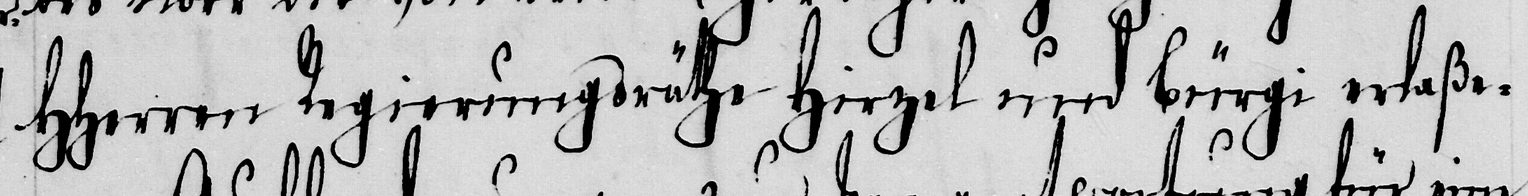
HHerren Regierungsräthe Hirzel und Bürgi erlaße¬
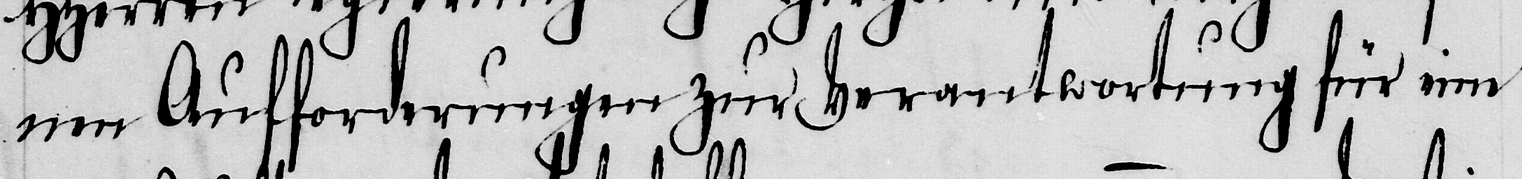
nen Aufforderungen zur Verantwortung für eine
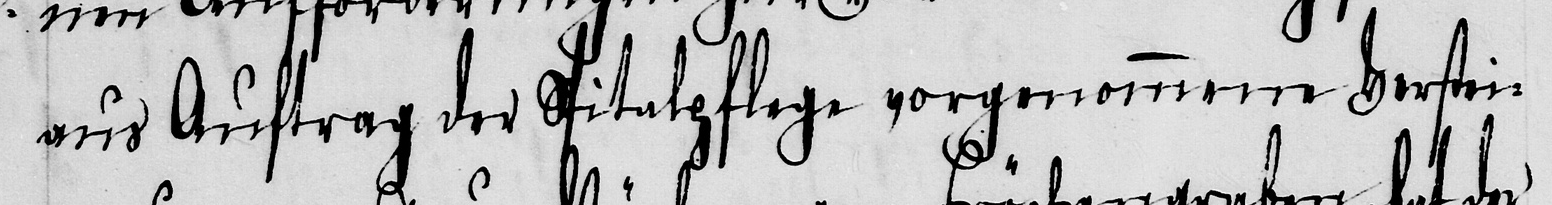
aus Auftrag der Spitalpflege vorgenommene Verstei¬
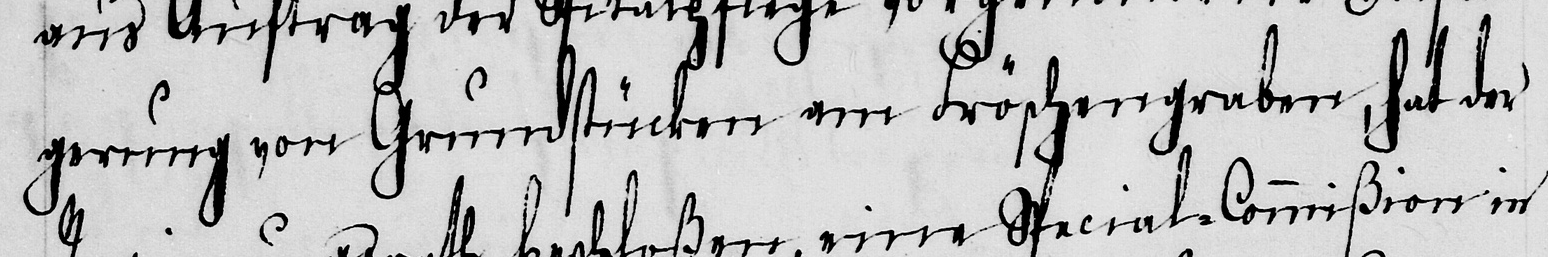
gerung von Grundstücken am Fröschengraben, hat der
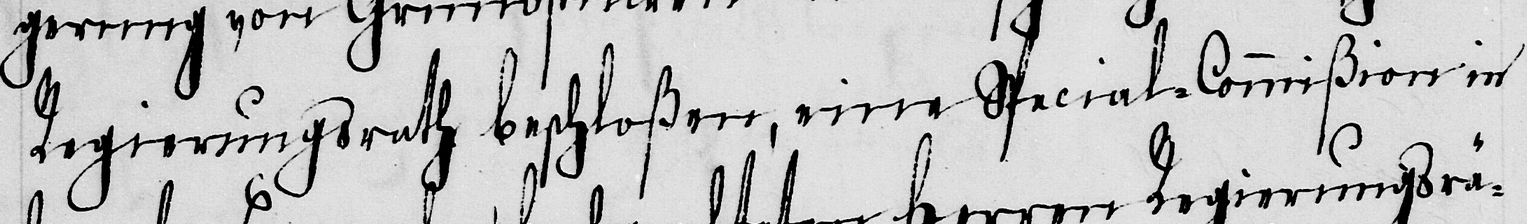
Regierungsrath beschloßen, eine Special-Commißion in
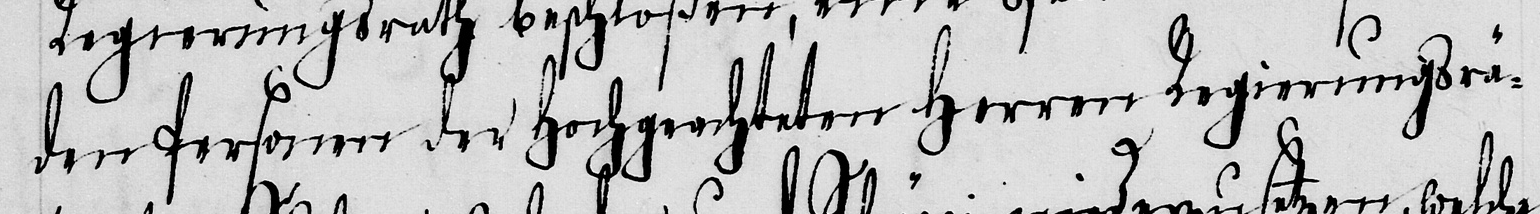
den Personen der Hochgeachteten Herren Regierungsrä¬
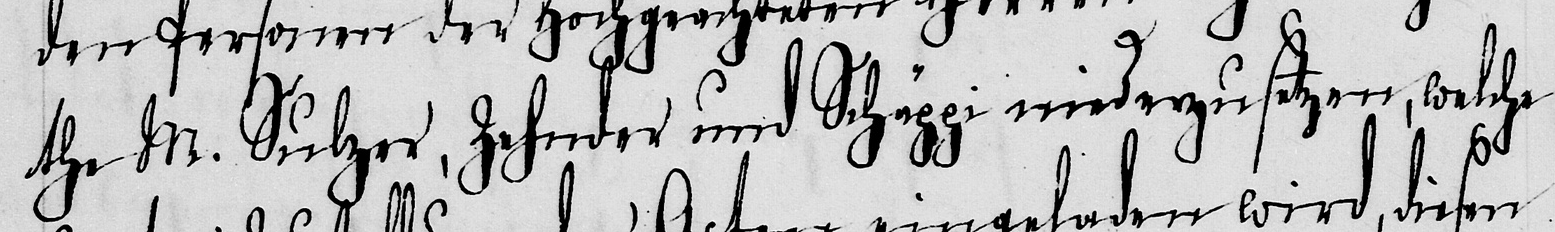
the M. Sulzer, Zehnder und Schäppi niederzusetzen, welche
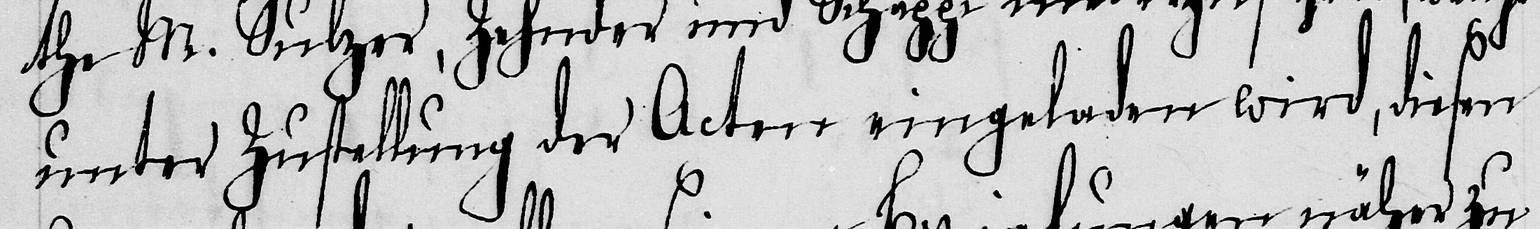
unter Zustellung der Acten eingeladen wird, diesen
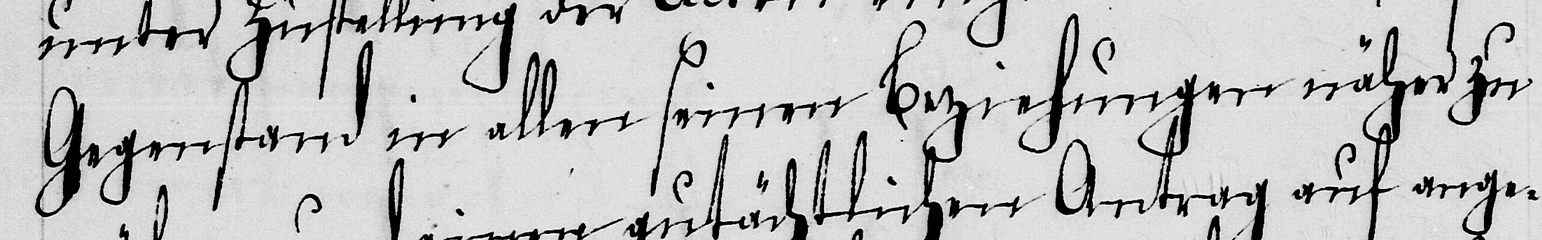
Gegenstand in allen seinen Beziehungen näher zu
